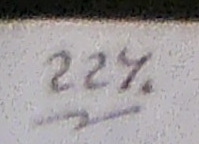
227.
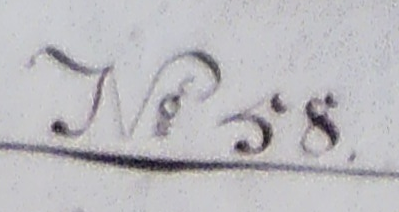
No͇ 58.
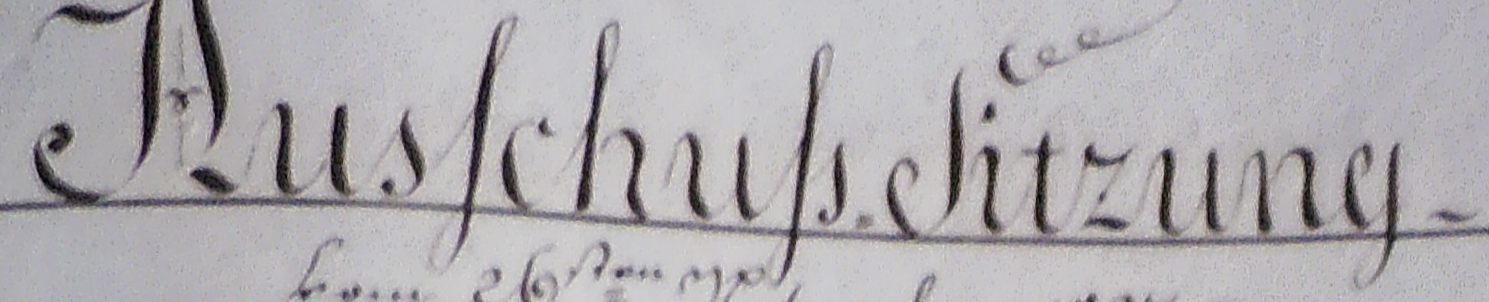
Ausschss=Sitzung
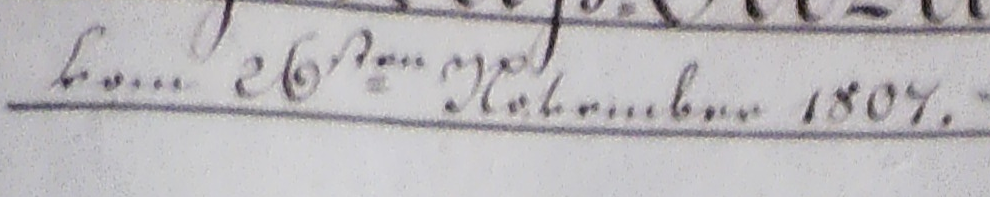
den 26ste͇n November 1807.
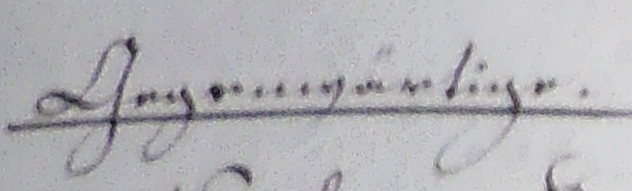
Gegenwärtige.
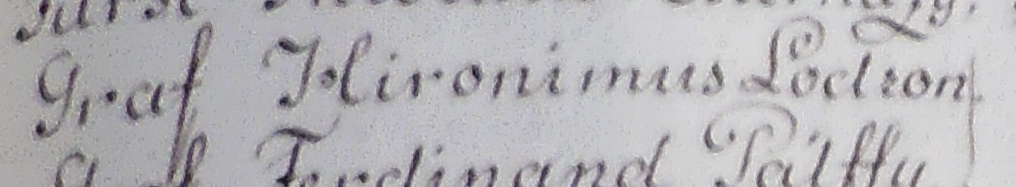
Graf Hironimus Lodron
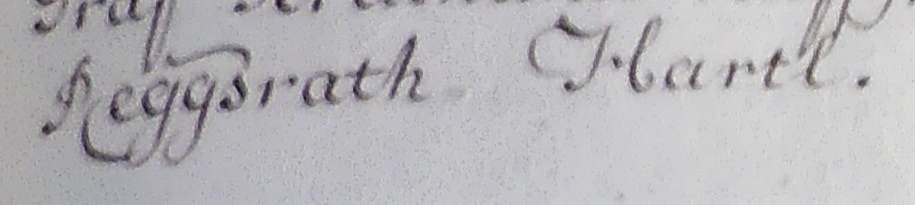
Reg͞gsrath Hartl.
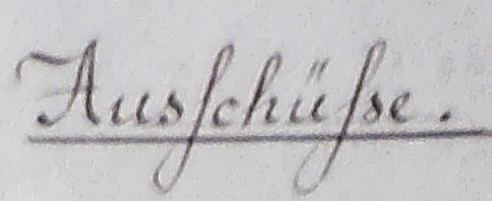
Ausschüsse.
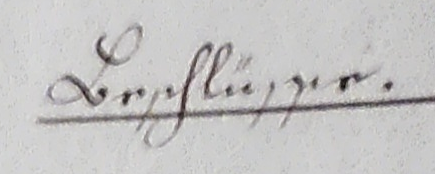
Beschlüsse.
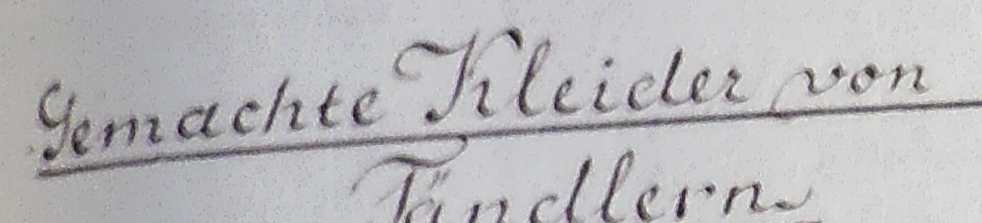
Gemachte Kleider von
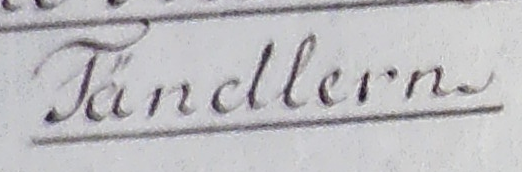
Tändlern.
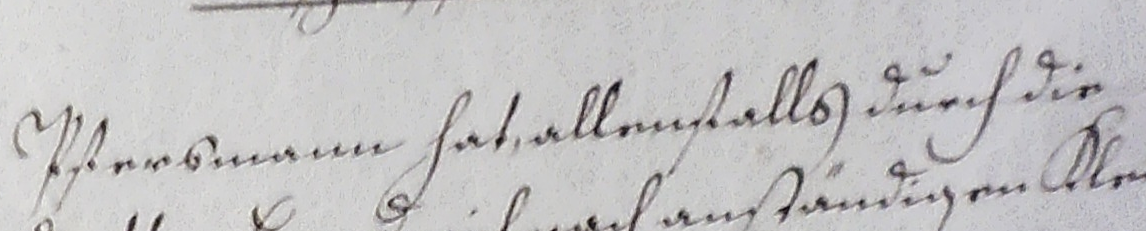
Pfersmann hat allenfalls durch die
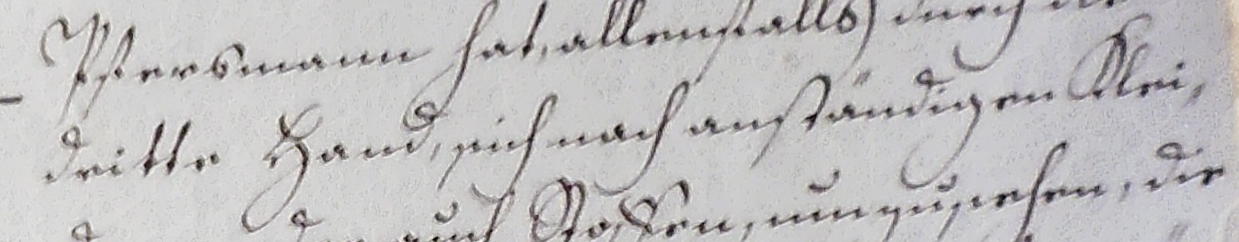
dritte Hand, sich nach anständigen Klei¬
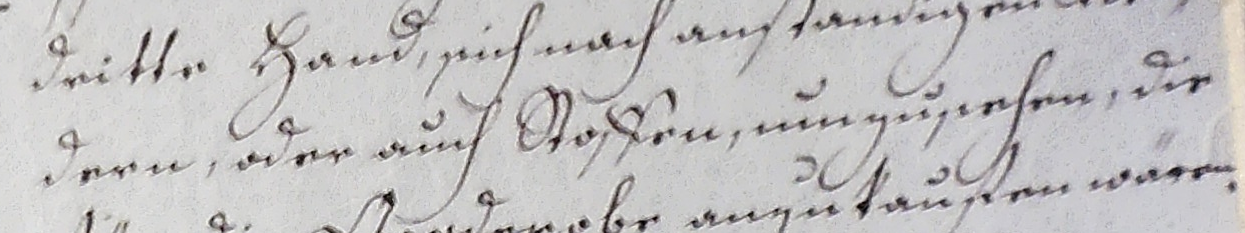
dern, oder auch Stoffen, umzusehen, die
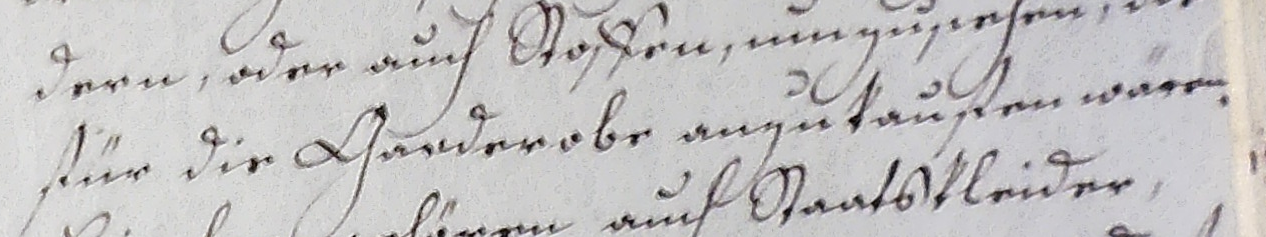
für die Garderobe anzukaufen wären.
